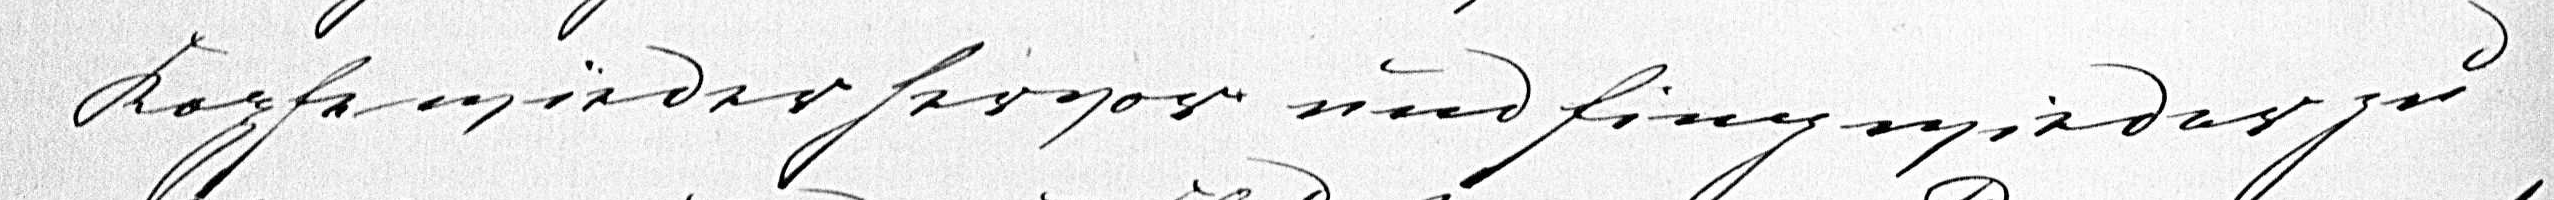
Kopfe wieder hervor und fing wieder zu
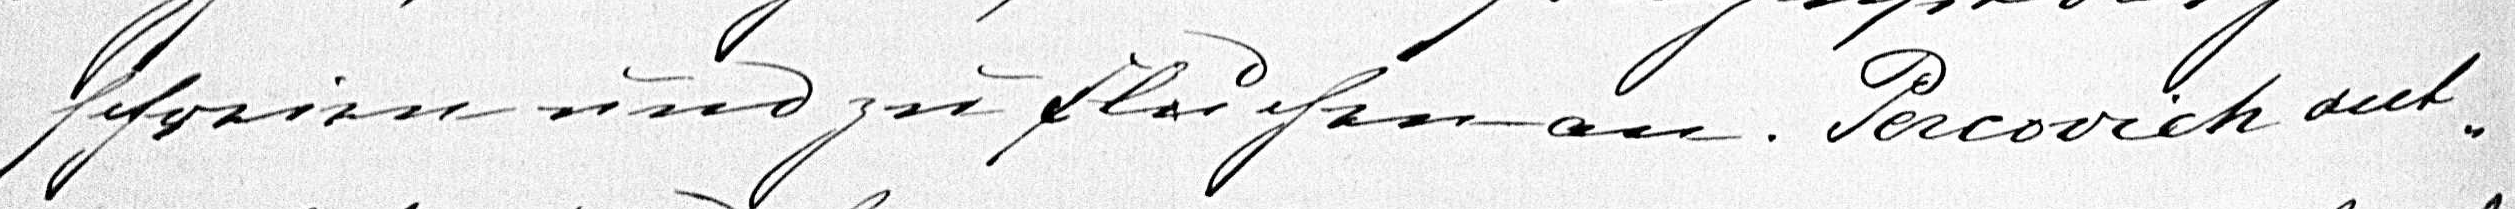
schreien und zu Fluchen an. Percovich ant¬
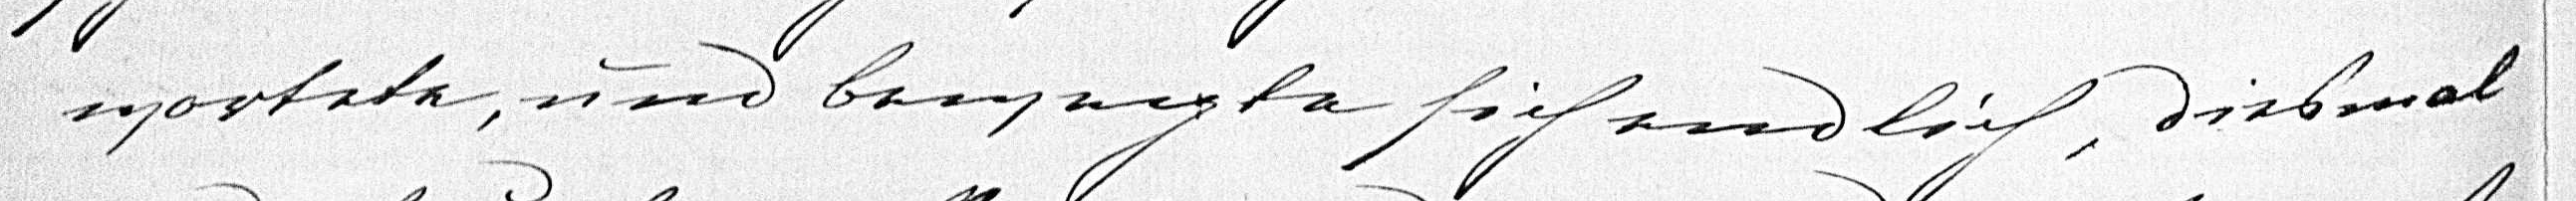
wortete, und bewegte sich endlich, diesmal
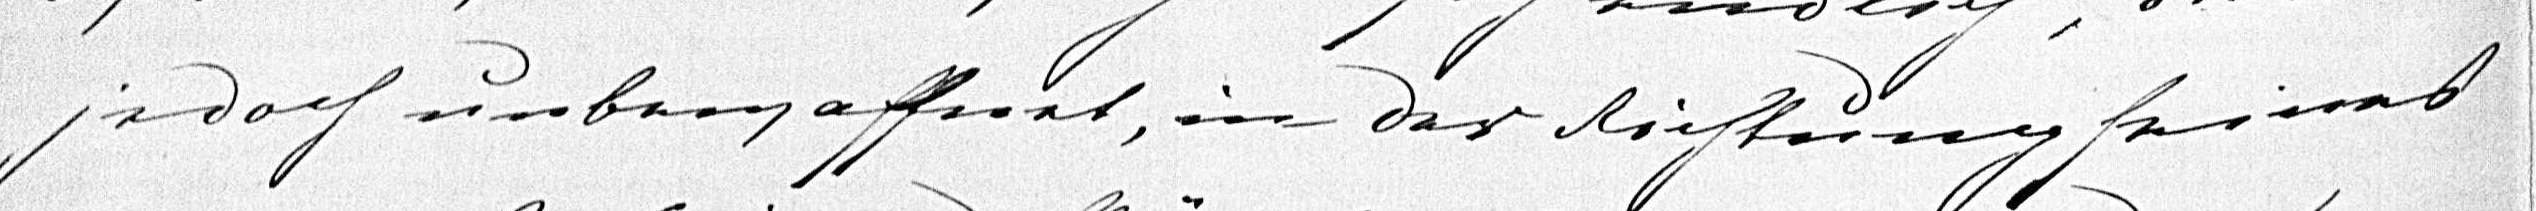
jedoch unbewaffnet, in der Richtung seines
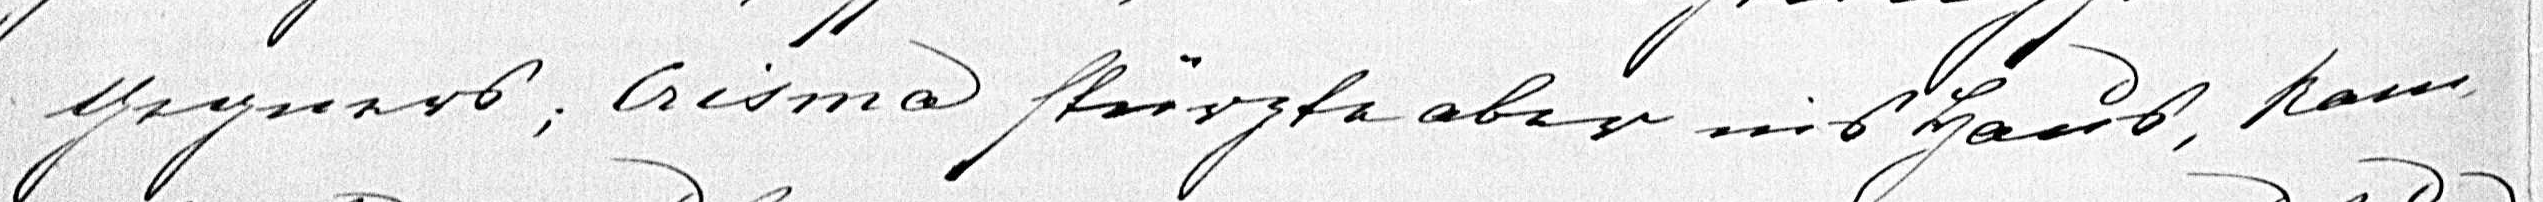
Gegners; Crisma stürzte aber ins Haus, kam
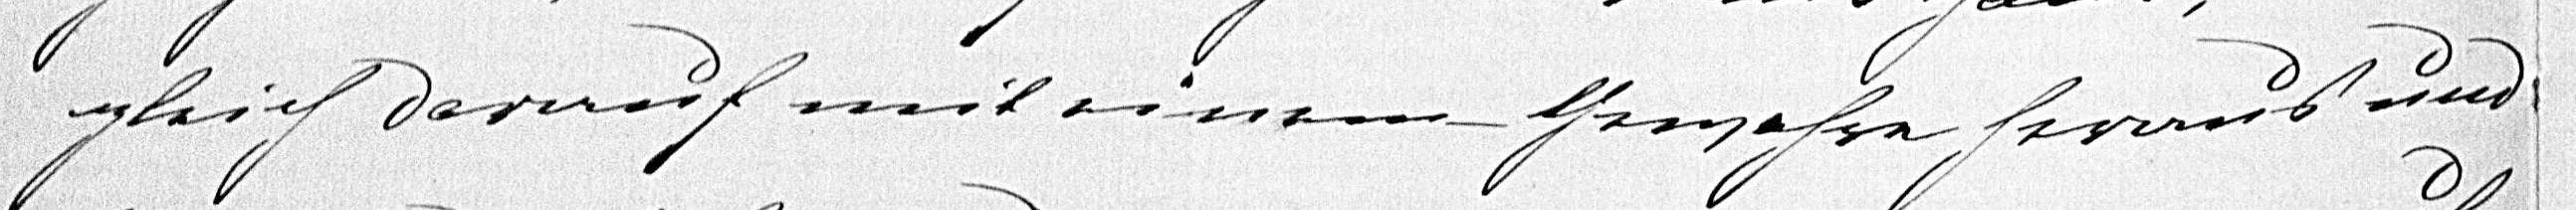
gleich darauf mit einem Gewehre heraus und
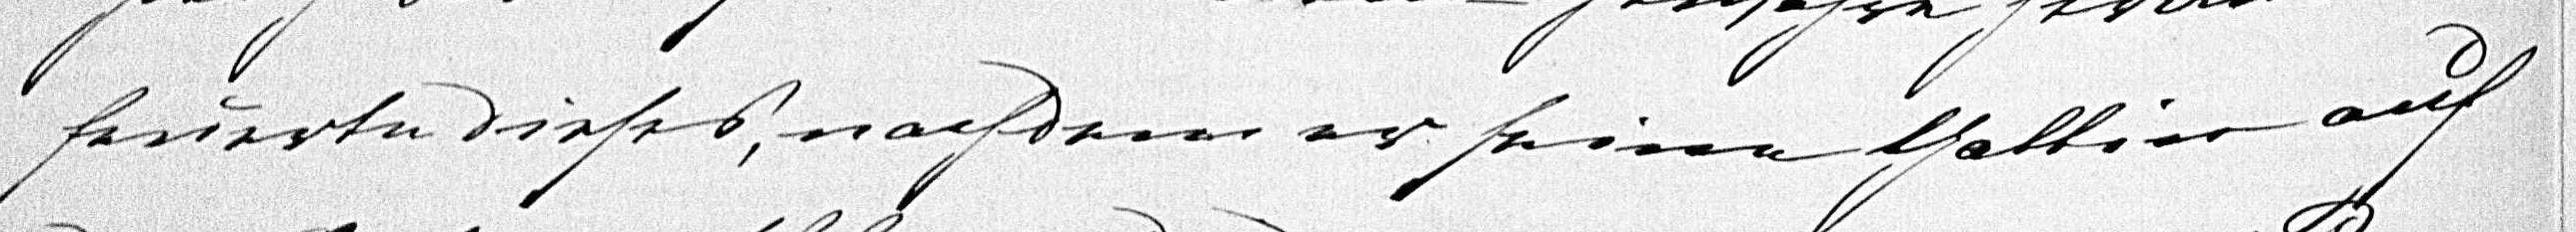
feuerte dieses, nachdem er seine Gattin auf
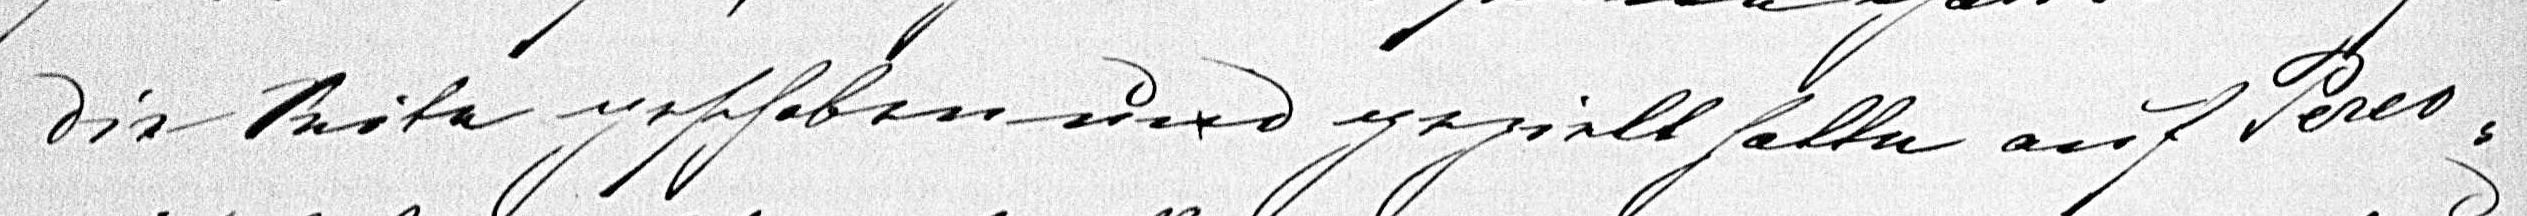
die Seite geschoben und gezielt hatte auf Perco¬
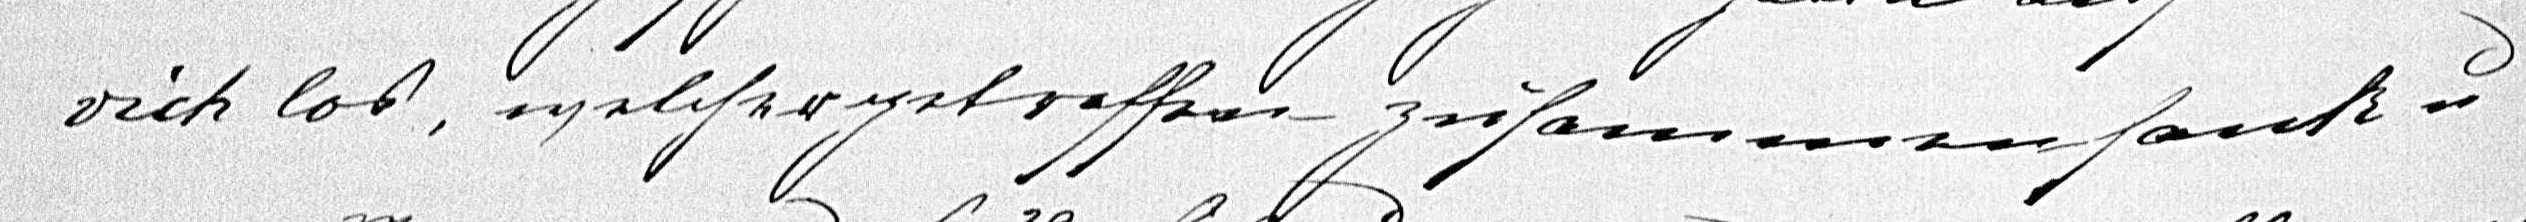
vich los, welcher getreffen zusammen fank u
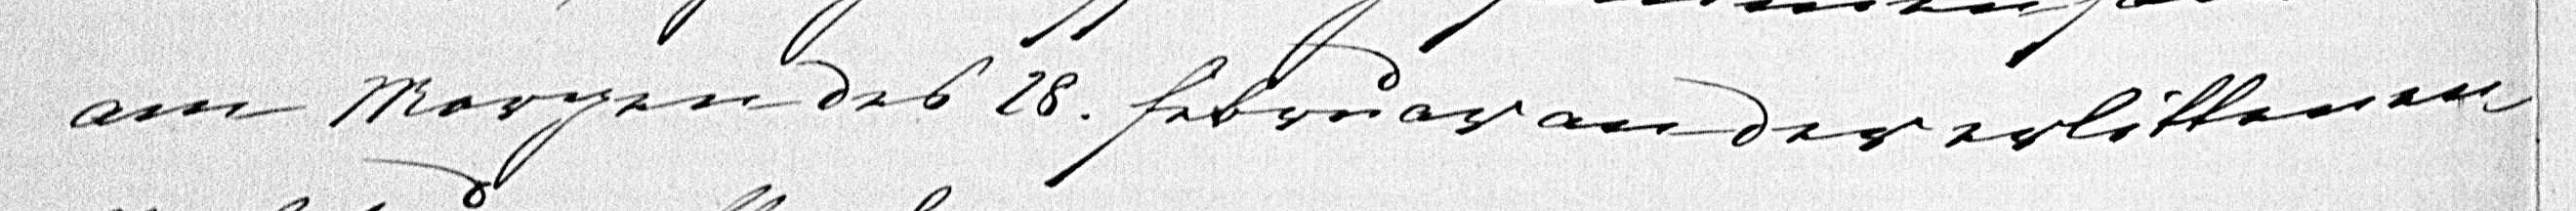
am Morgen des 28. februar an der erlittenen
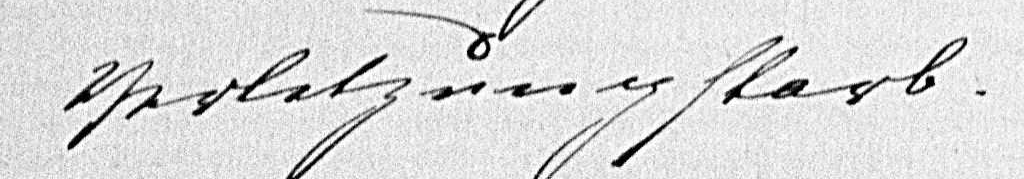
Verletzung starb.
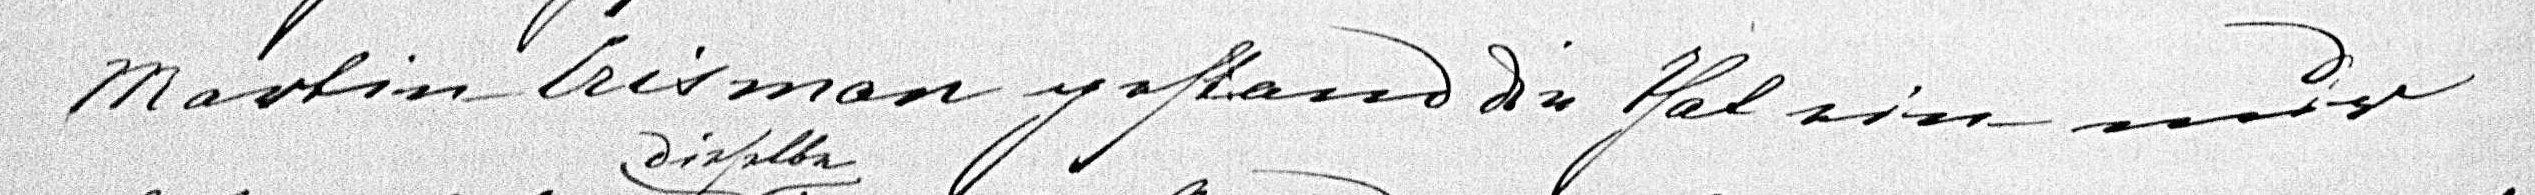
Martin Crisman gestand die That ein nur
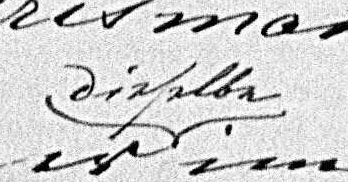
dieselbe
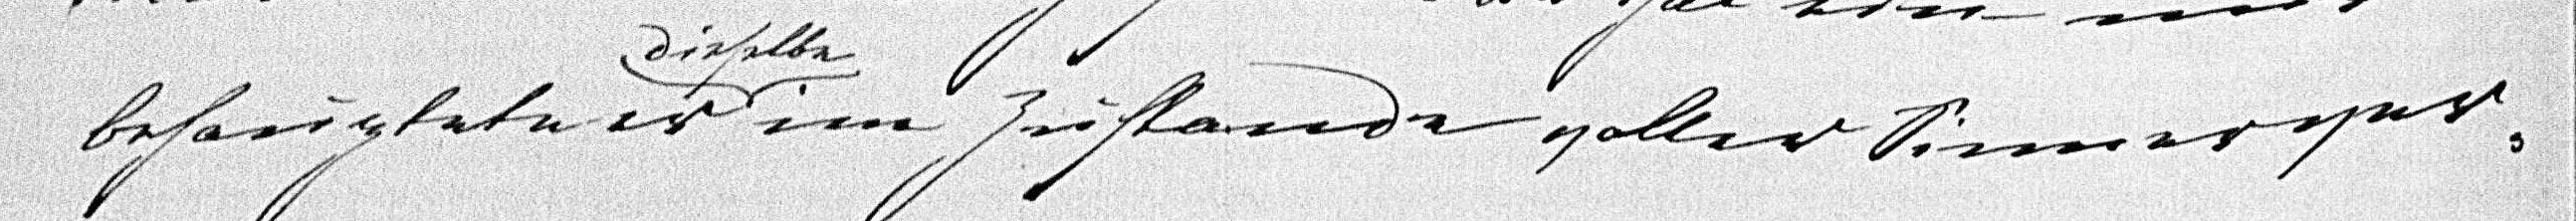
behauptete er im Zustande voller Sinnesver¬
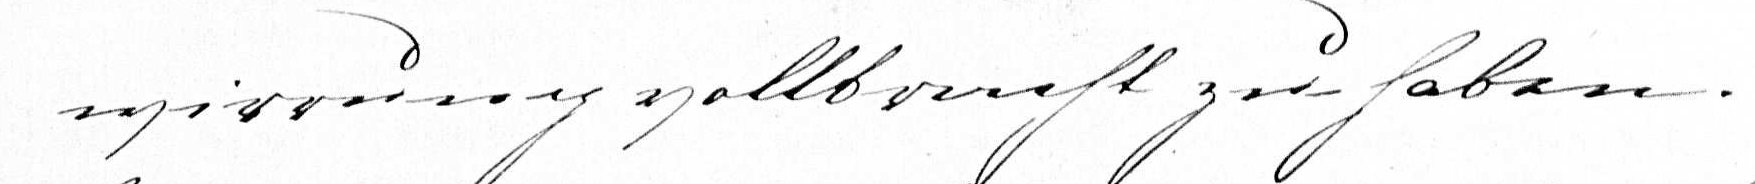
wirrung vollbracht zu haben.
